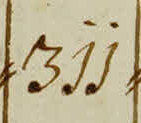311
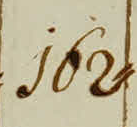162
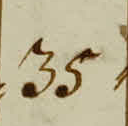35
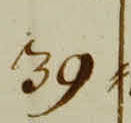39
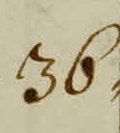36
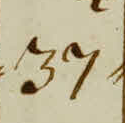37
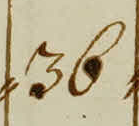36
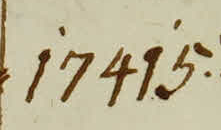17415
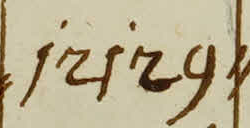12129
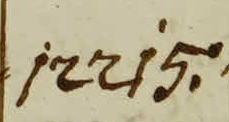12215.
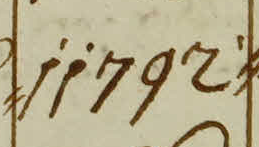11792
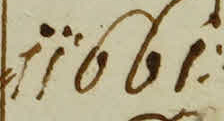11661
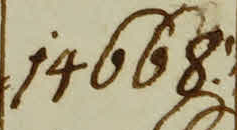14668
